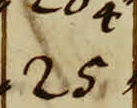25
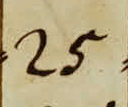25
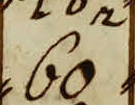60
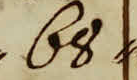68
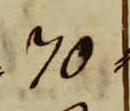70
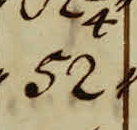52
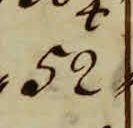52
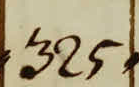325
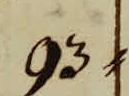93
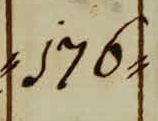176
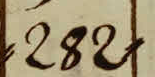282
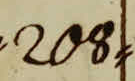208
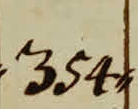354
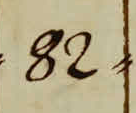82
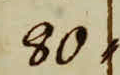80
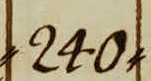240
